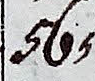56
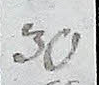30
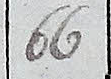66
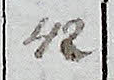42
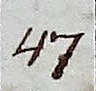47
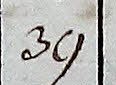39
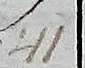41
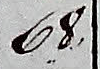68
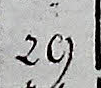29
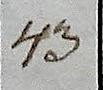43
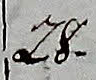28
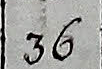36
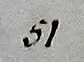51
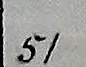51
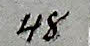48
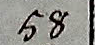58
